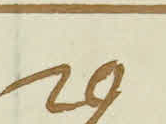29
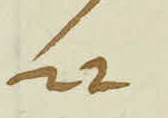22
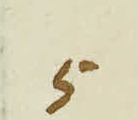5
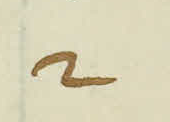2
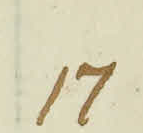17
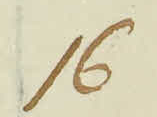16
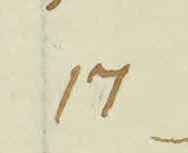17
